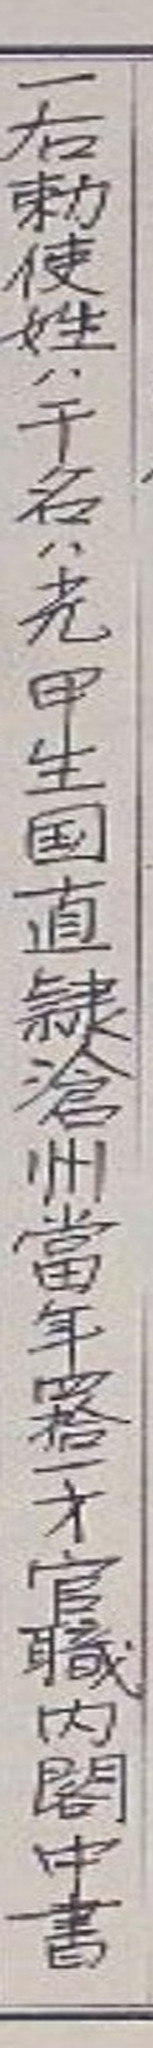一右勅使姓は干名は光甲生国直隷滄州当年四拾一才官職内閣中書
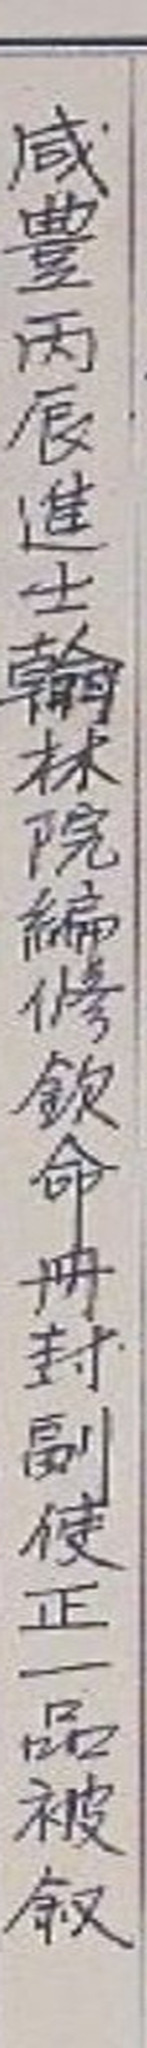咸豊丙辰進士翰林院編修欽命冊封副使正一品被叙
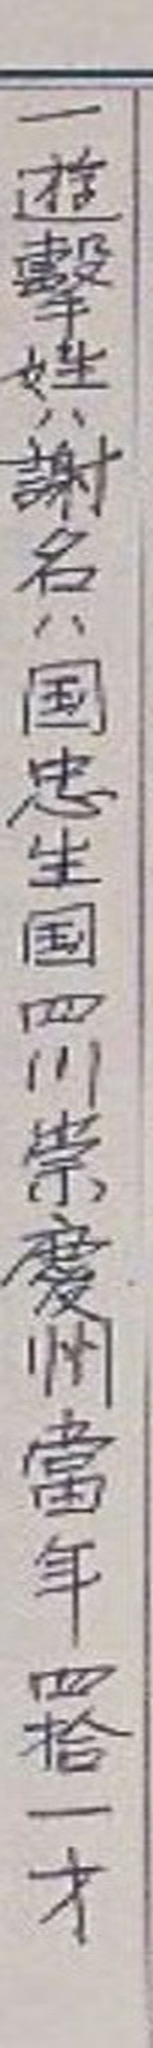一遊撃姓は謝名は国忠生国四川崇慶州当年四拾一才
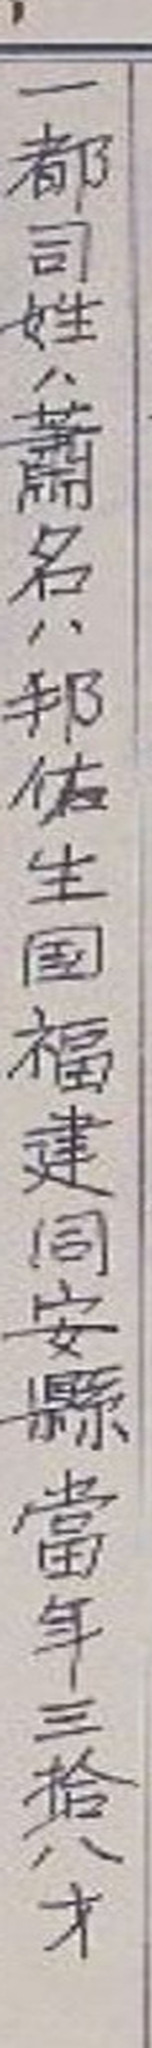一都司姓は蕭名は邦佐生国福建同安県当年三拾八才
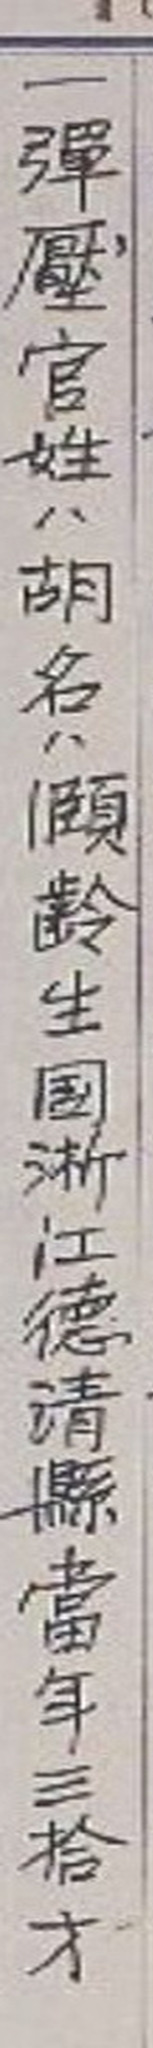一弾圧官姓は胡名は頥齢生国浙江徳清県当年三拾才
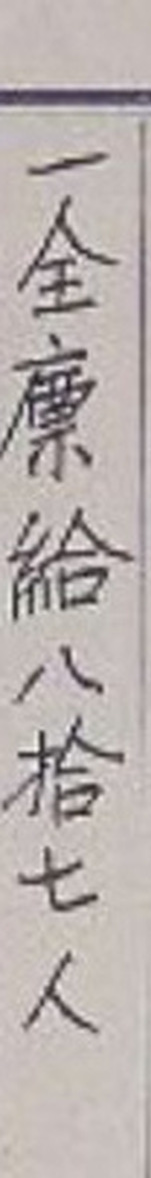一全廩給八拾七人

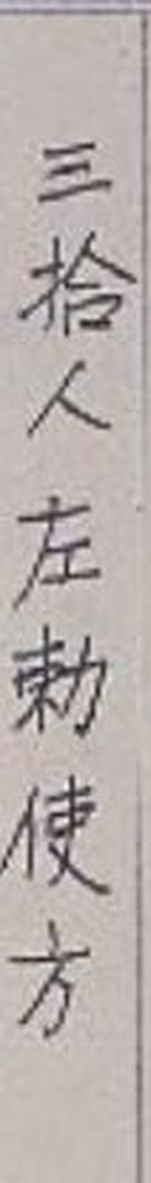三拾人左勅使方
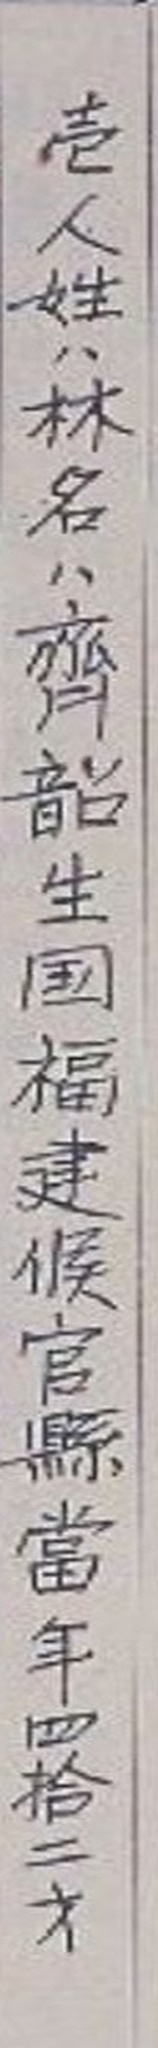壱人姓は林名は斉韶生国福建候官県当年四拾二才
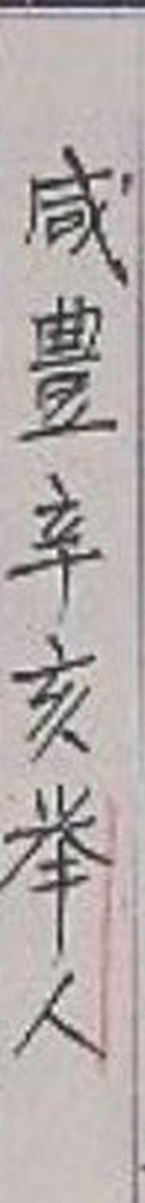咸豊辛亥挙人
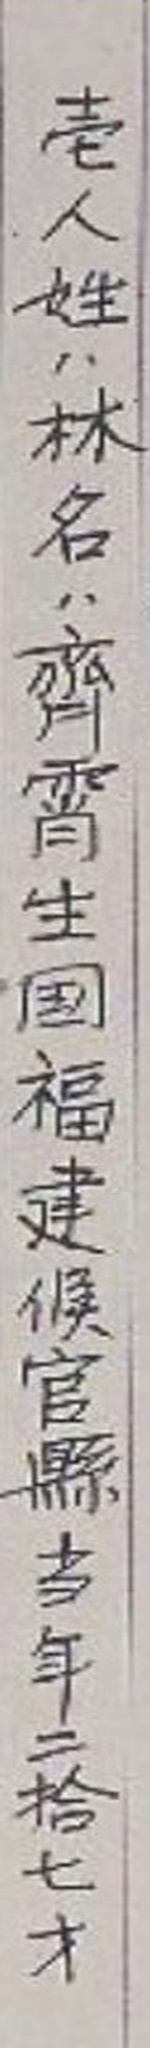壱人姓は林名は斉霄生国福建候官県当年二拾七才
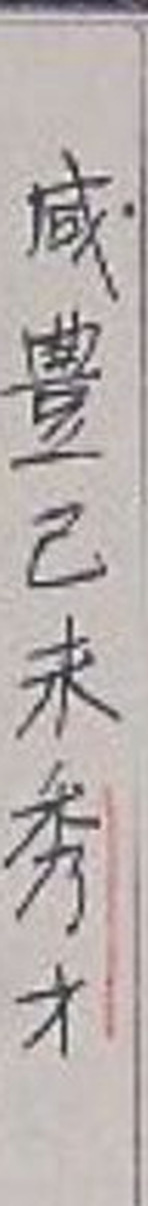咸豊己未秀才
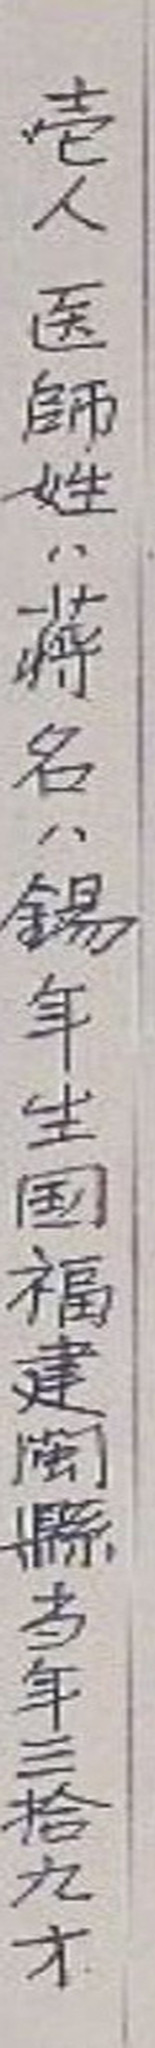壱人医師姓は蒋名は錫年生国福建閩県当年三拾九才
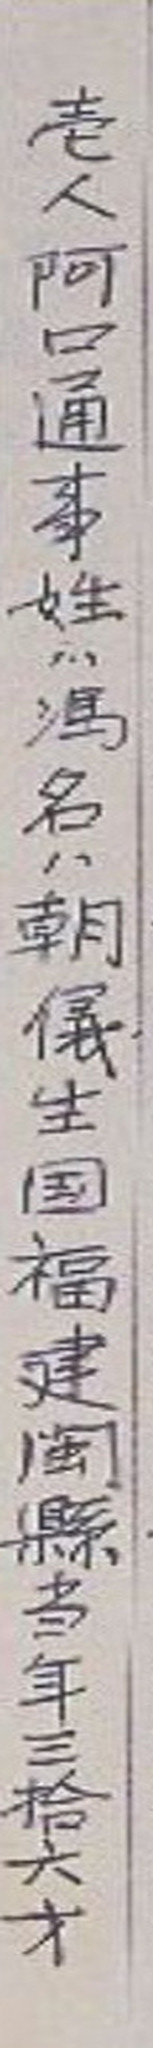壱人阿口通事姓は馮名は朝儀生国福建閩県当年三拾六才
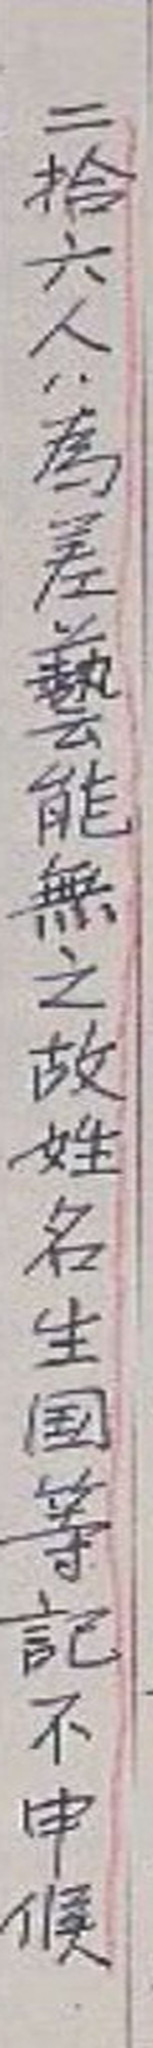二拾六人は為差芸能無之故姓名生国等記不申候
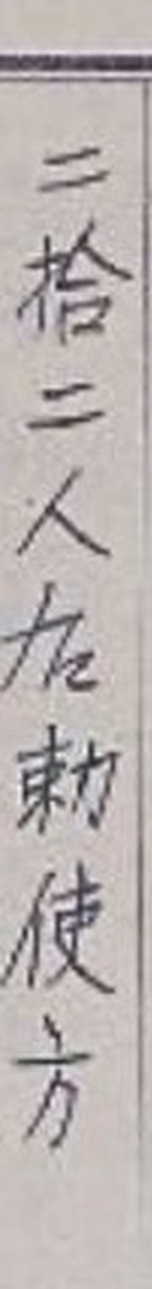二拾二人右勅使方
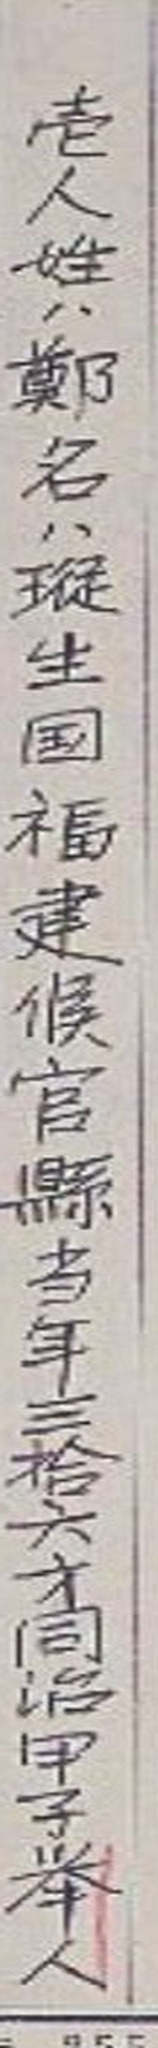壱人姓は鄭名は瑽生国福建候官県当年三拾六才同治甲子挙人
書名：支那冊封使来琉諸記 下巻
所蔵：University of the Ryukyus Library
